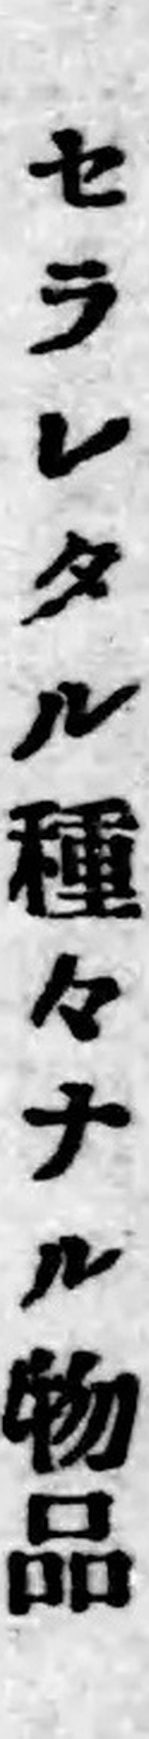セラレタル種々ナル物品
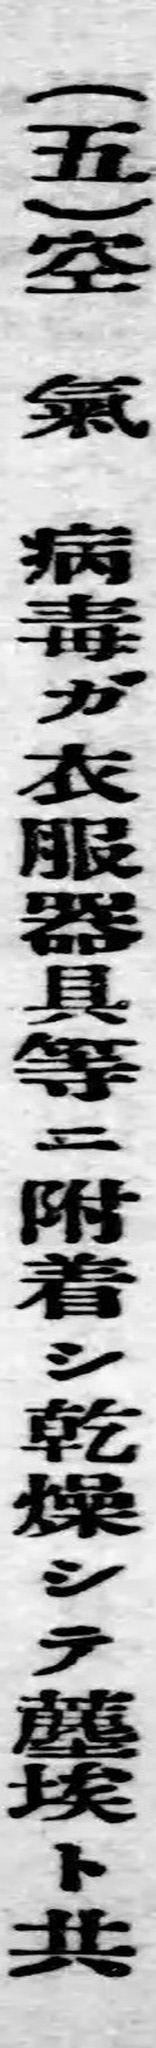(五)空氣病毒ガ衣服器具等ニ附着シ乾燥シテ塵埃ト共
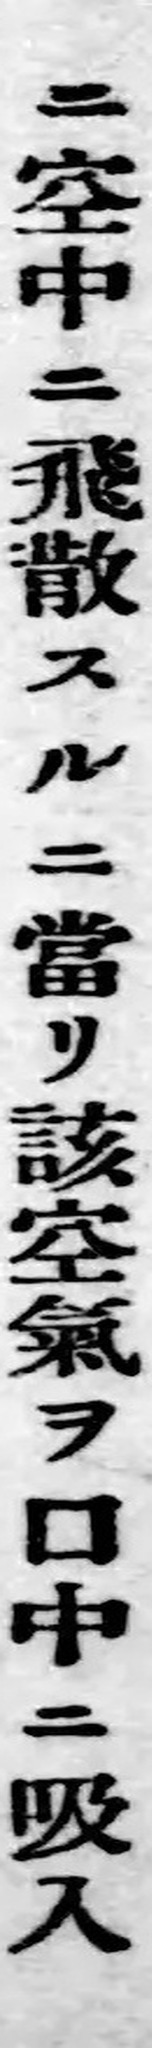ニ空中ニ飛散スルニ當リ該空氣ヲ口中ニ吸入
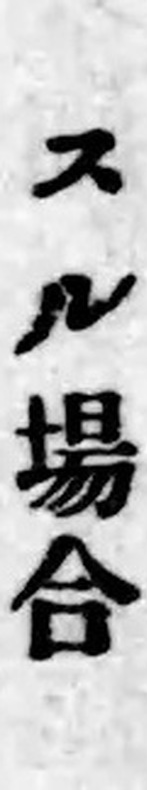スル場合
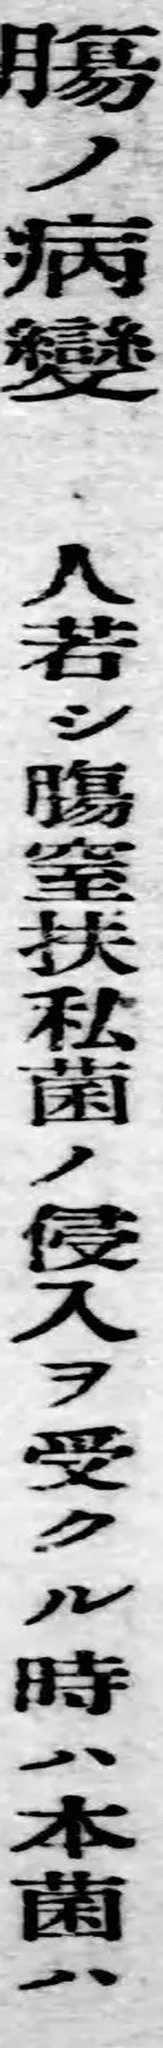膓ノ病變人若シ膓窒扶私菌ノ侵入ヲ受クル時ハ本菌ハ
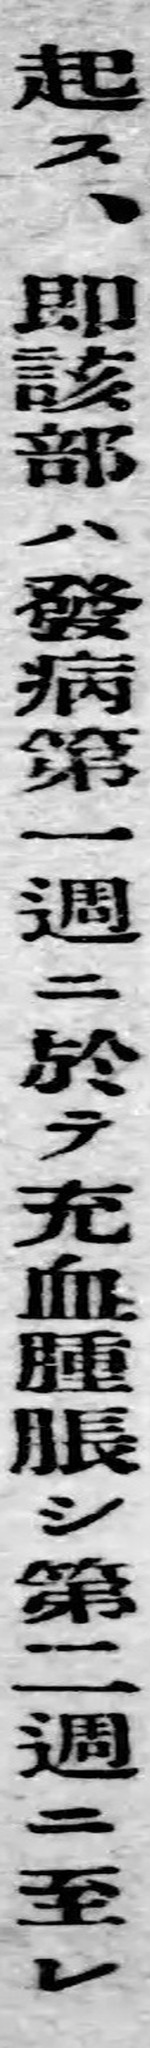起ス、即該部ハ發病第一週ニ於テ充血腫脹シ第二週ニ至レ
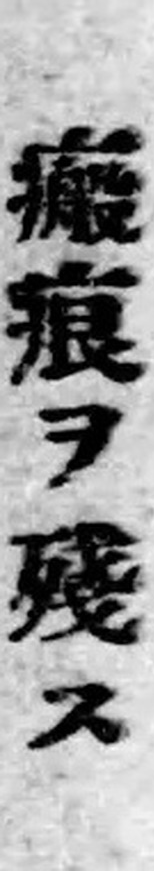瘢痕ヲ残ス
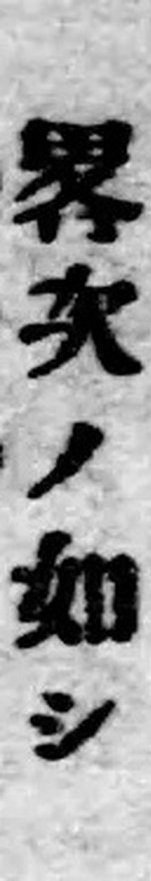畧次ノ如シ
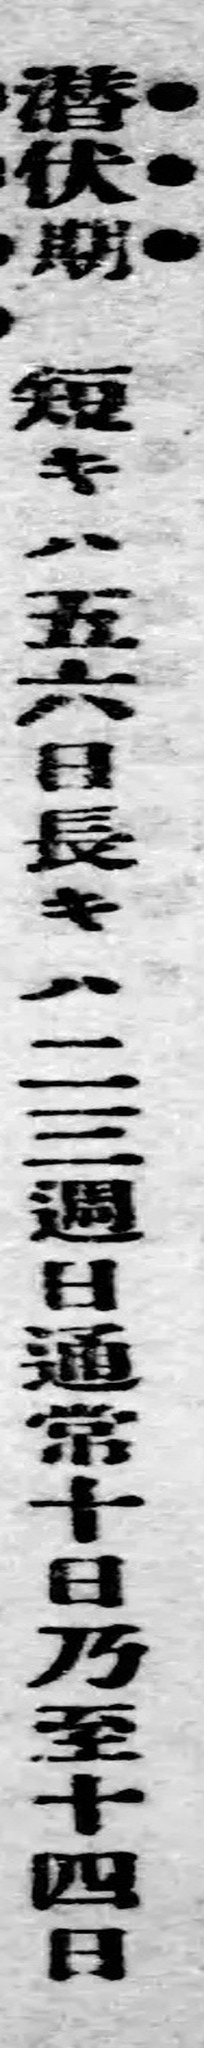潜伏期短キハ五六日長キハ二三週日通常十日乃至十四日
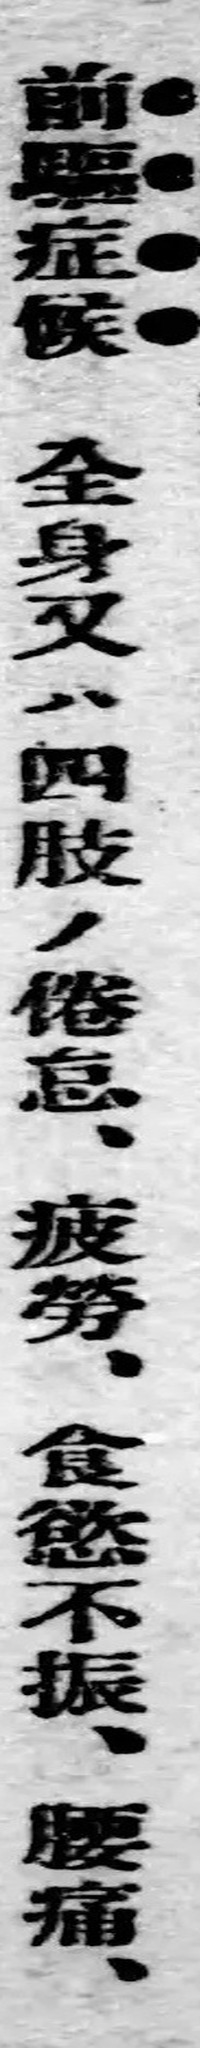前驅症候全身又ハ四肢ノ倦怠、疲勞、食慾不振、腰痛、
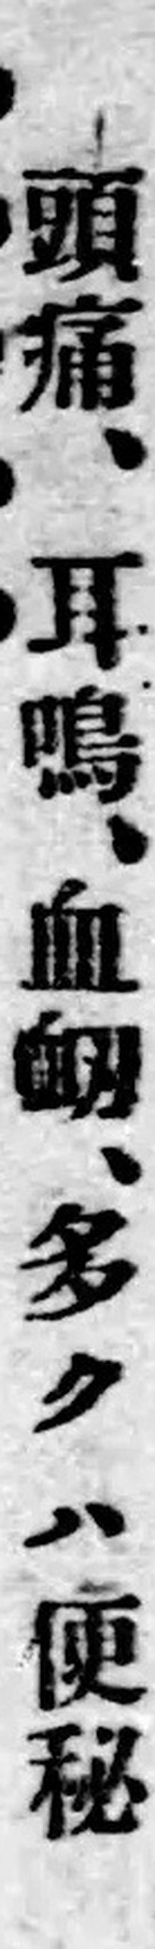頭痛、耳鳴、血衂、多クハ便秘
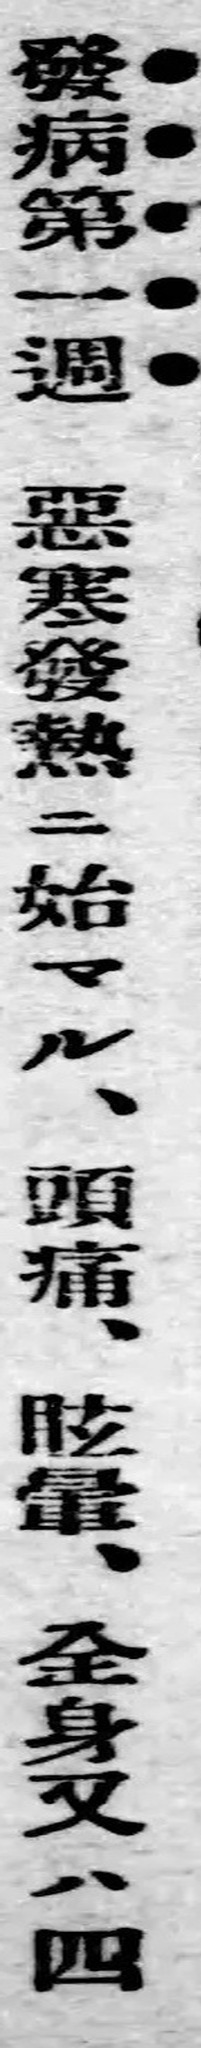發病第一週惡寒發熱ニ始マル、頭痛、眩暈、全身又ハ四
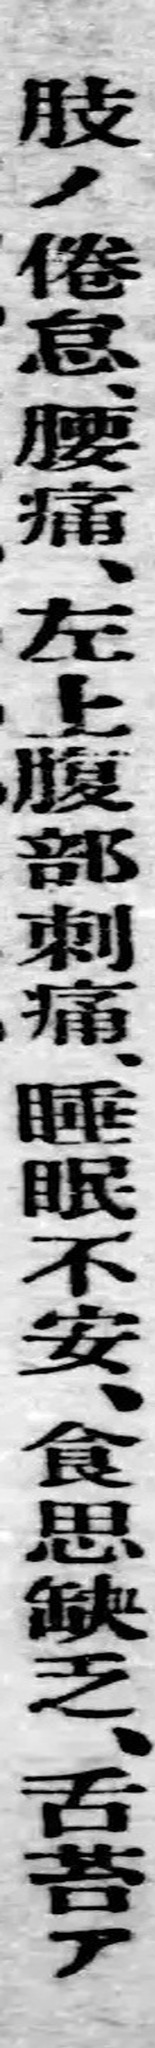肢ノ倦怠、腰痛、左上腹部刺痛、睡眠不安、食思缺乏、舌苔ア
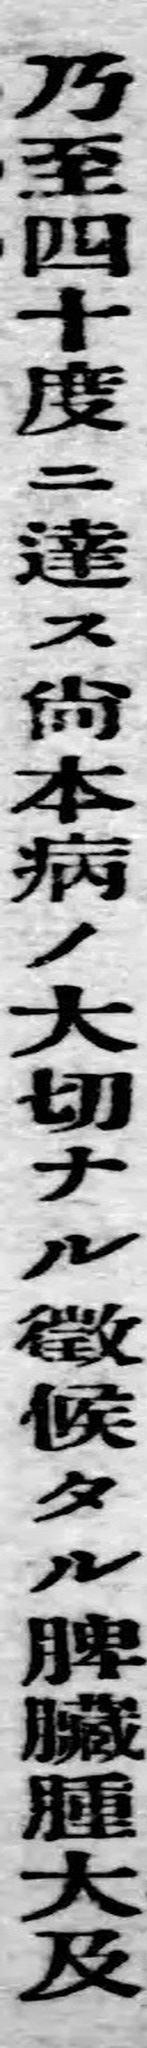乃至四十度ニ達ス尚本病ノ大切ナル徴候タル脾臟腫大及
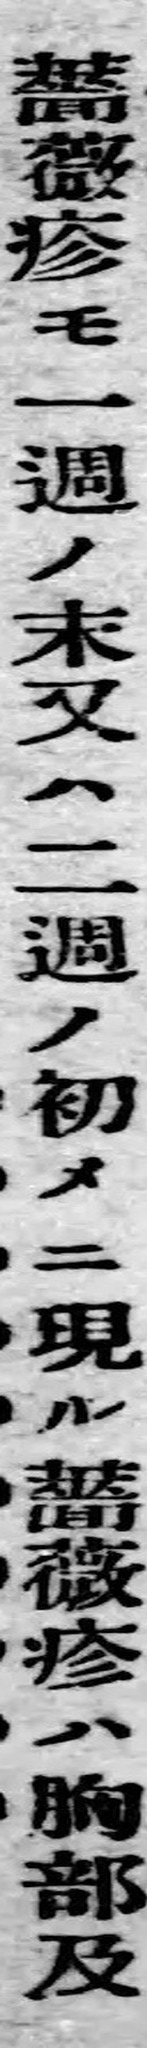薔薇疹モ一週ノ末又ハ二週ノ初メニ現ル薔薇疹ハ胸部及

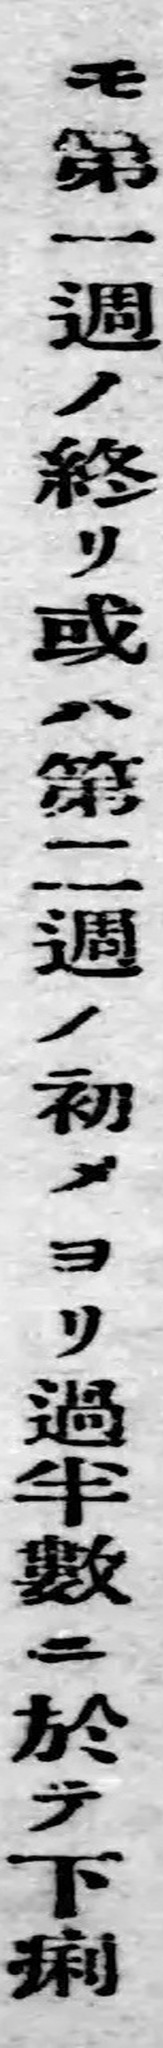モ第一週ノ終リ或ハ第二週ノ初メヨリ過半數ニ於テ下痢
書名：袖珍防疫必携
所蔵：国立国会図書館 National Diet Library, JAPAN
